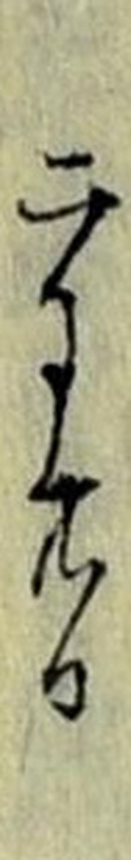二月廿日
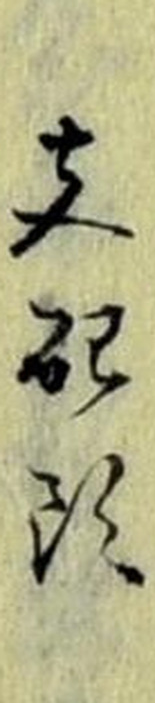支配頭
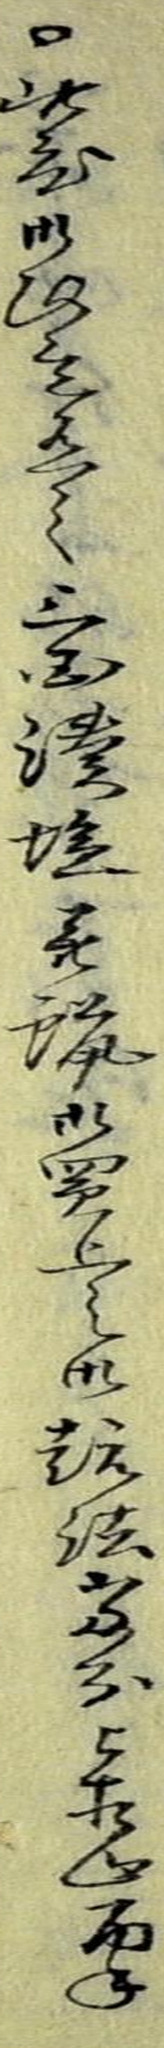○此度御趣意有之三国湊塩并蝋御買上之御趣法当分被相止酉年

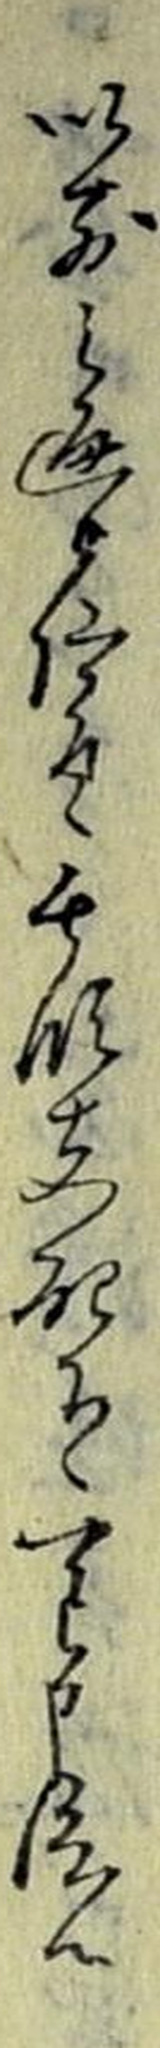以前之通被仰付候其段支配下へ可被申渡候
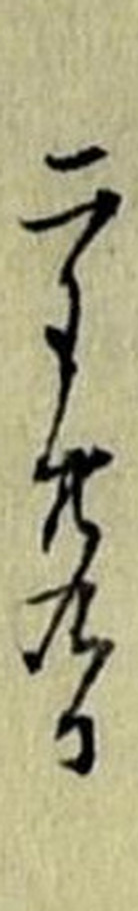二月廿九日
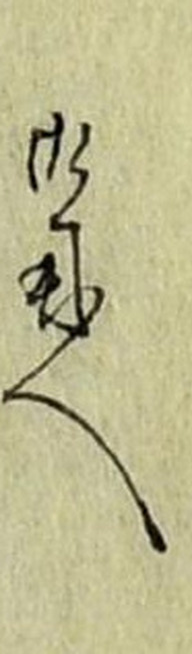御用人
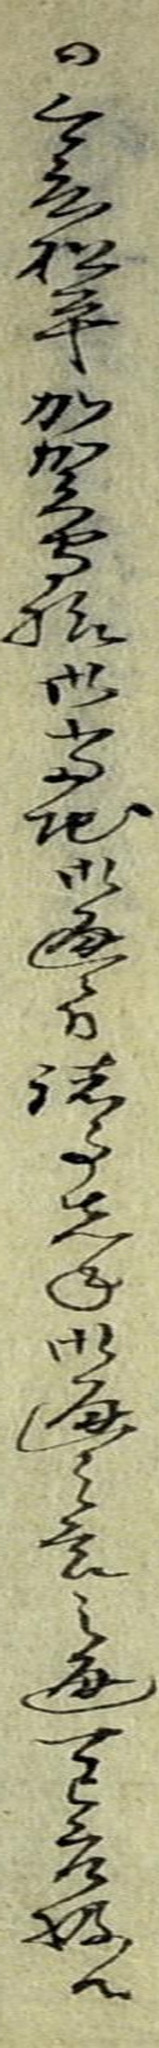○今度松平加賀守様御当地御通に付諸事先年御通之節之通可被取扱候
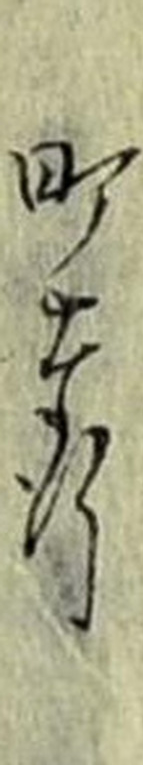町奉行
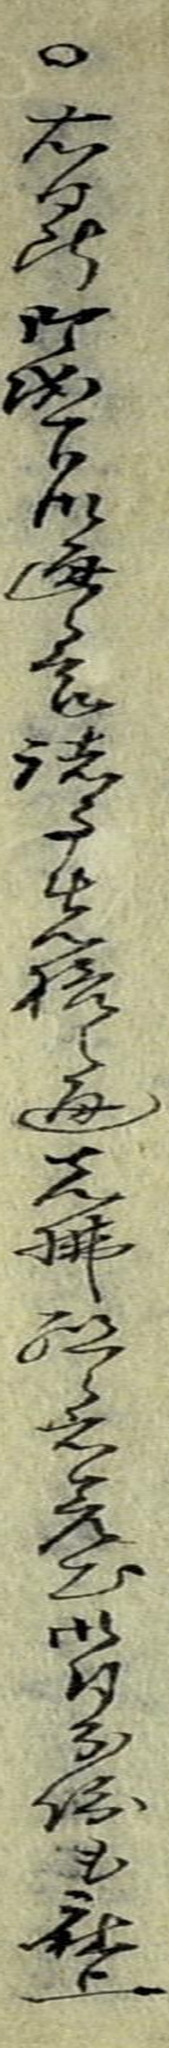○右同断御城下御通之節諸事先格之通先払組之者差出御自分儀も袴上
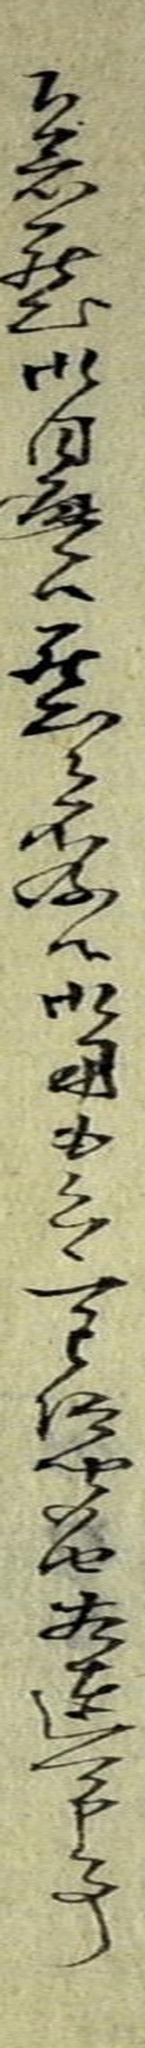下着罷出御目通は罷出に不及候御用も候ハゝ可被仰聞候由相達可申事
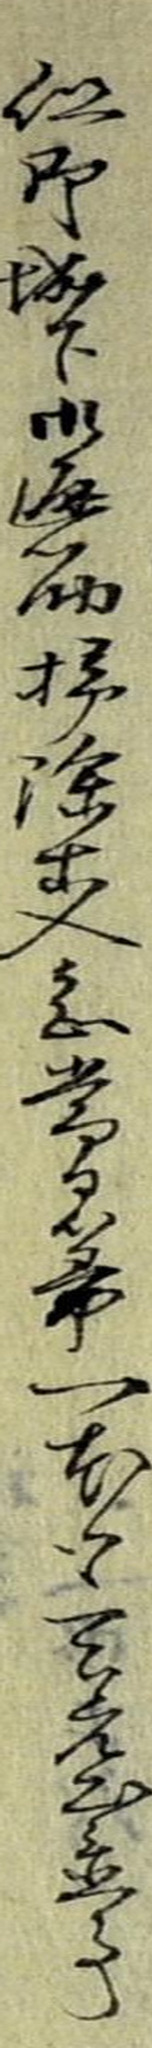但御城下御道筋掃除等入念当日箒一本つヽ可差出置事
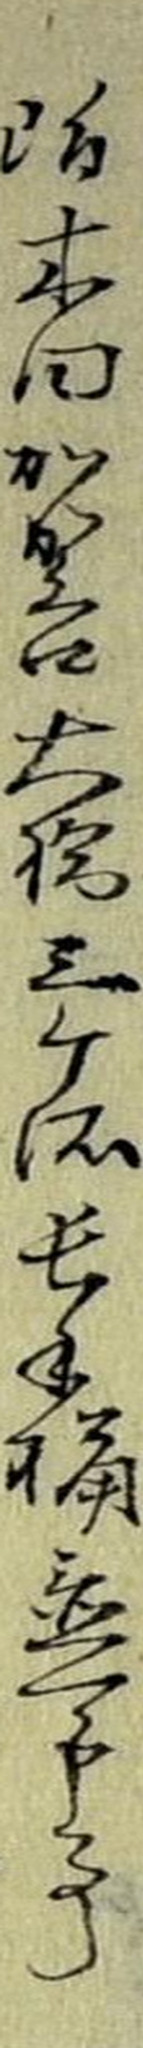附木田加賀口大橋三ヶ所長手桶置可申事
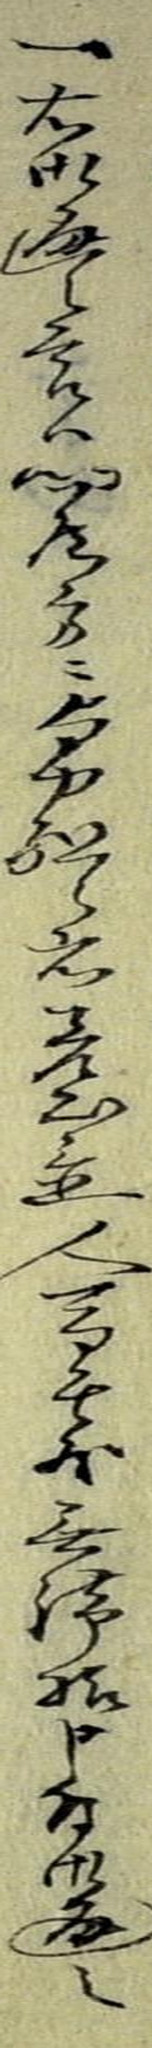一右御通之節は問屋方に与力之者差出置人馬其外無滞様申付御通之
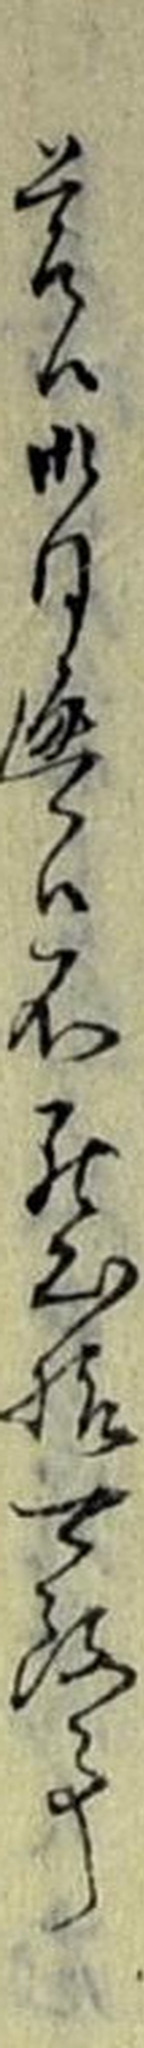節は御目通は不罷出様可致事
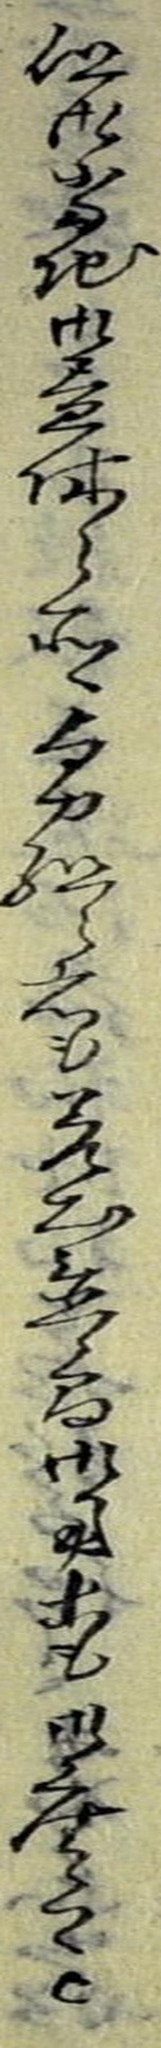但当地御昼休之所へ与力組之者も差出置候間御用等も御座候ハゝ被
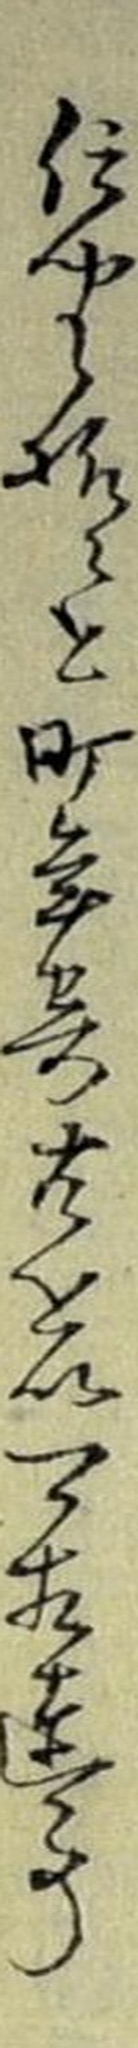仰聞候様にと町年寄共を以可相達事
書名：命令之部 六
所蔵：福井県文書館 Fukui Prefectural Archives
